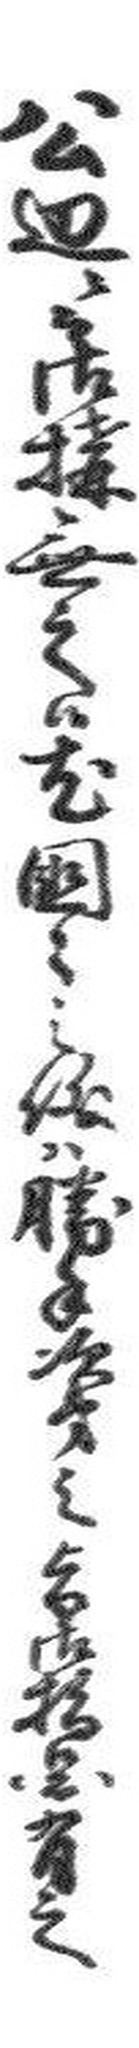公辺ニ而御構無之候尤国々之儀は勝手次第之旨御指図有之
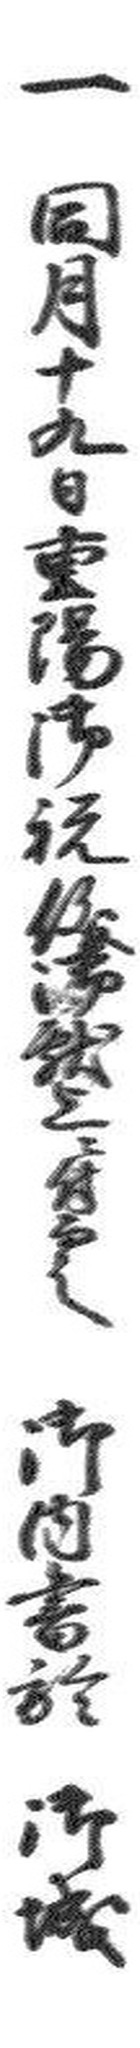一同月十九日重陽御祝儀御献上ニ付而之御内書於御城
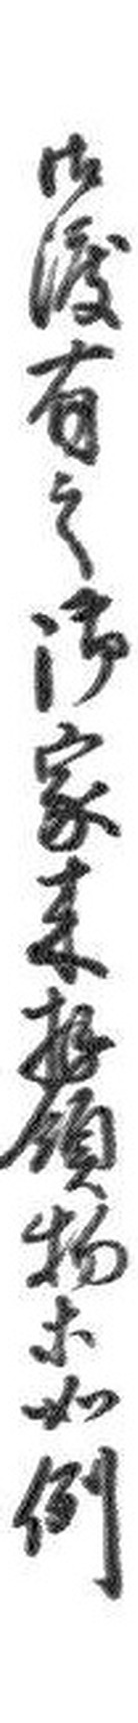御渡有之御家来拝領物等如例
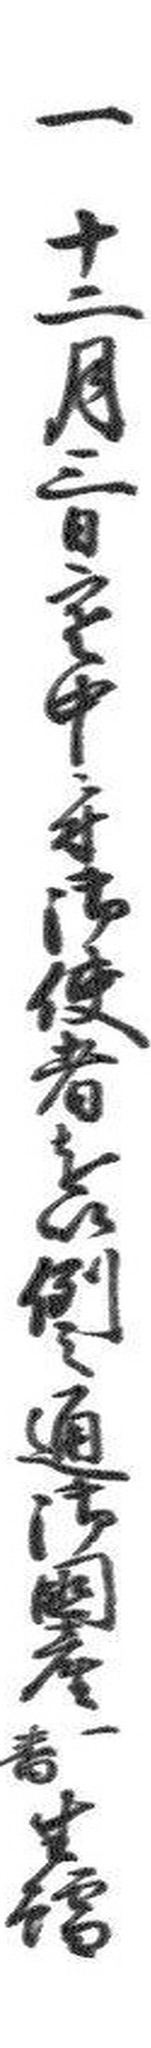一十二月三日寒中ニ付御使者を以例之通御国産一番生鱈
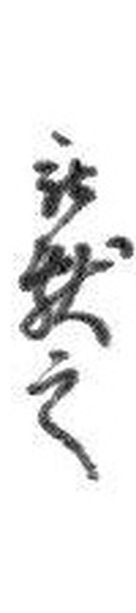被献之
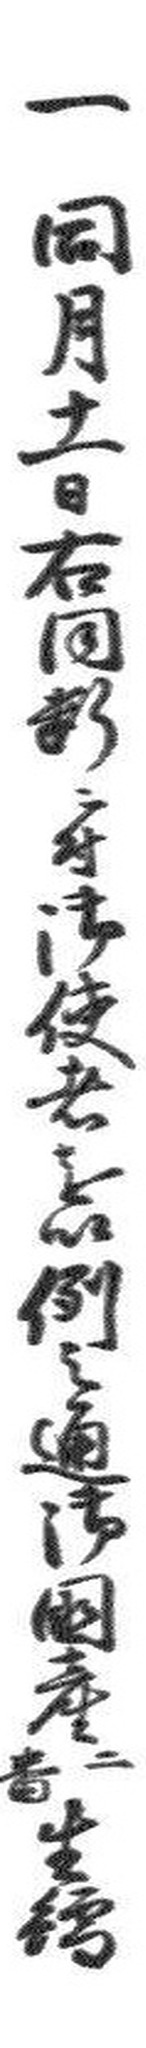一同月十一日右同断ニ付御使者を以例之通御国産二番生鱈
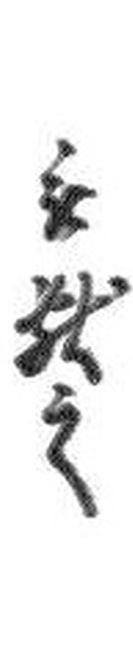被献之

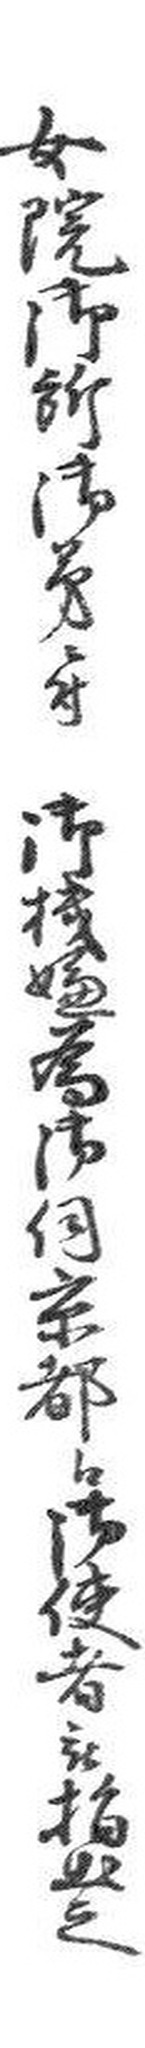女院御所御弟ニ付御機嫌為御伺京都江御使者被指出之
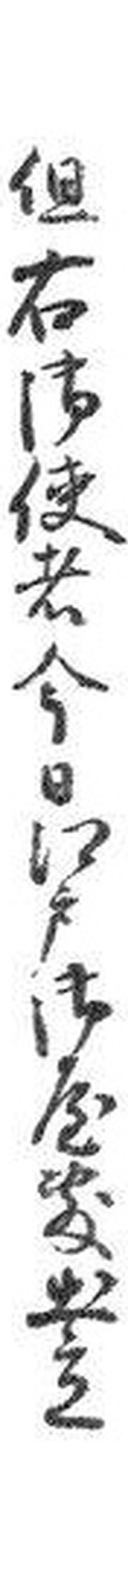但右御使者今日江戸御屋敷出立
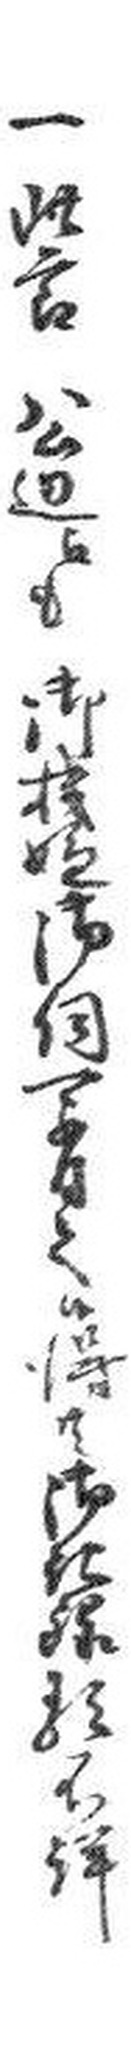一此節公辺江も御機嫌御伺可有之候得共御記録類不詳
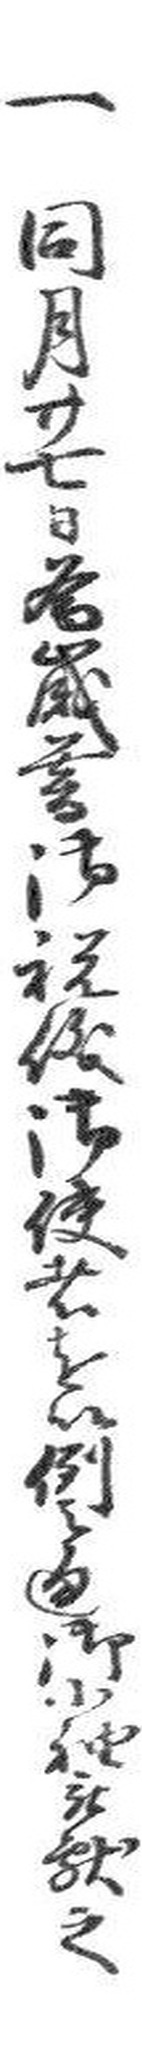一同月廿七日為歳暮御祝儀御使者を以例之通御小袖被献之
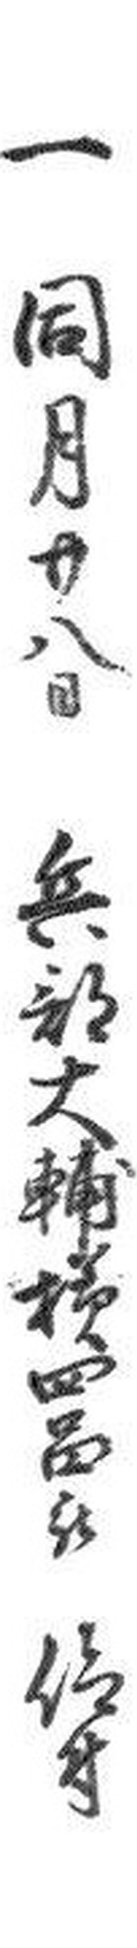一同月廿八日兵部大輔様四品被仰付
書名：家譜 八 光通公 従寛文十年到同十二年
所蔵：福井県文書館 Fukui Prefectural Archives
